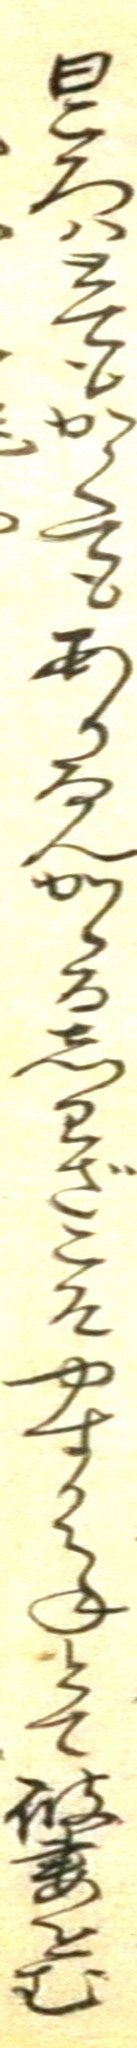日ころはとてもかくてもありなんかゝるしわざこそやすからねとて彼妻をむ
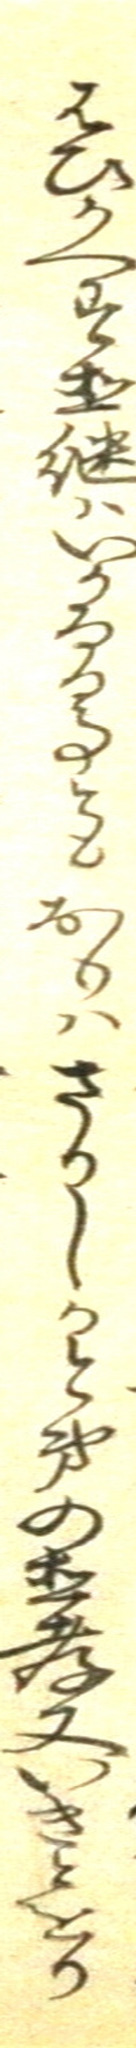はひかへす直継はいかなる事ともおもはさりしかと弟の直孝又いきとをり
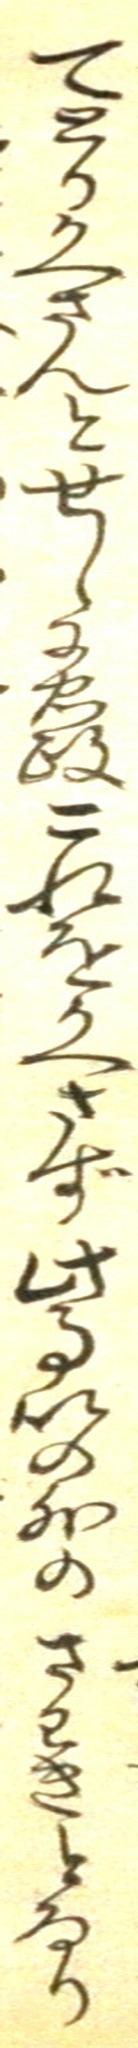てとりかへさんとせしに忠政これをかへさず此事以の外のさわきとなり
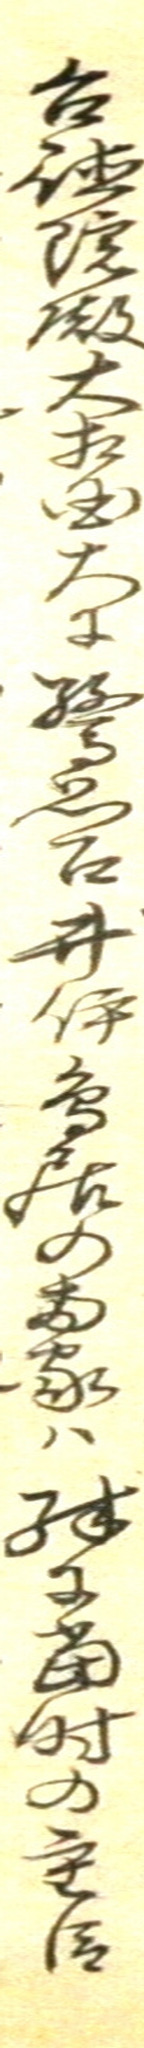台徳院殿大相国大に驚思召井伊鳥居の両家は殊に当時の重臣
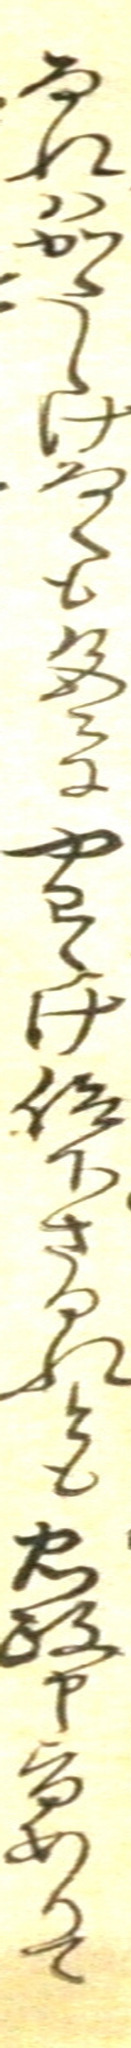なれはかたしけなくも色々にやわらけ仰下さるれとも忠政申旨ありて
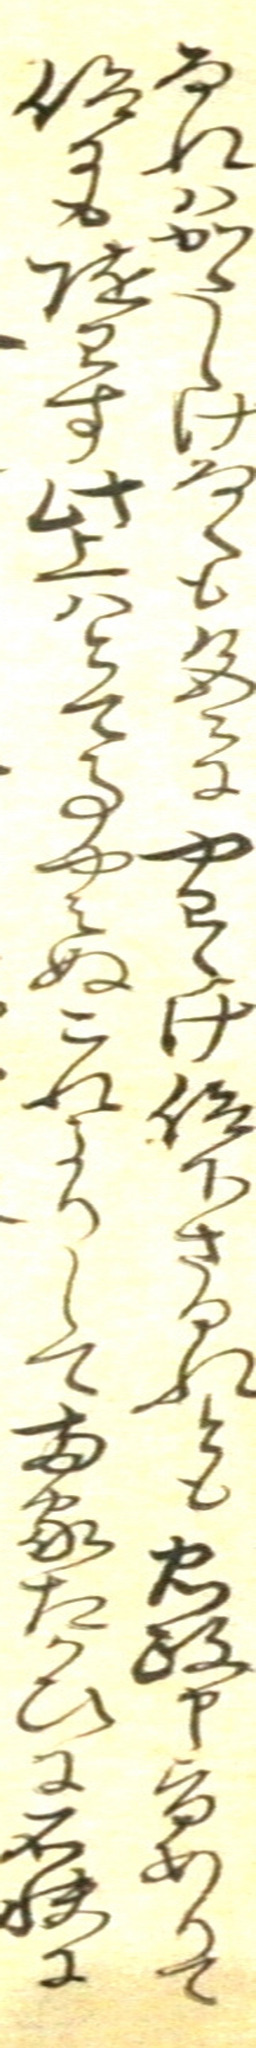仰にも随わす此上はとて事やみぬこれよりして両家たかひに不快に
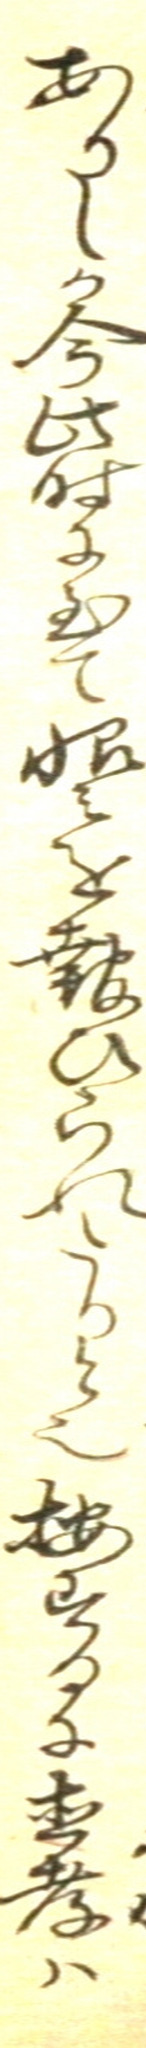ありしか今此時に至て恨みを報ひられたりと也按するに直孝は
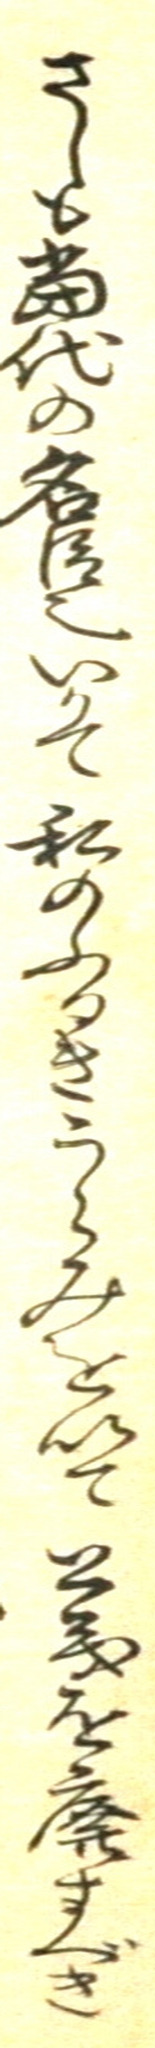さしも累代の名臣也いかて私のふるきうらみを以て公義を廃すべき
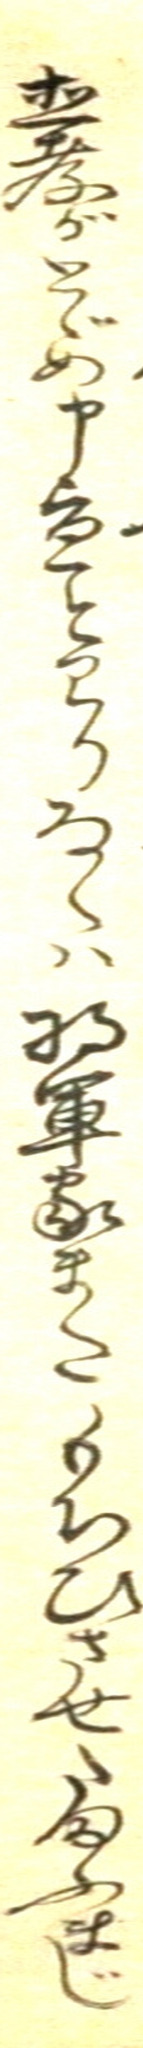直孝がとゞめ申旨ことわりなくは将軍家またもちひさせたまふまじ
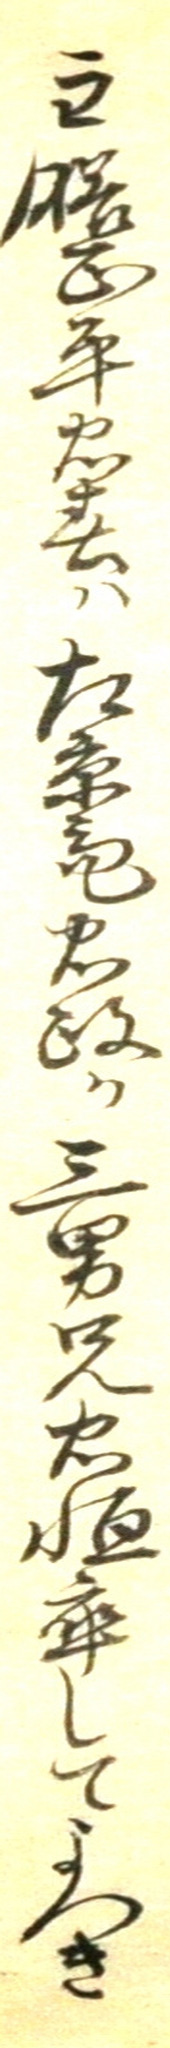主膳正平忠春は左京亮忠政か三男兄忠恒卒してよつき
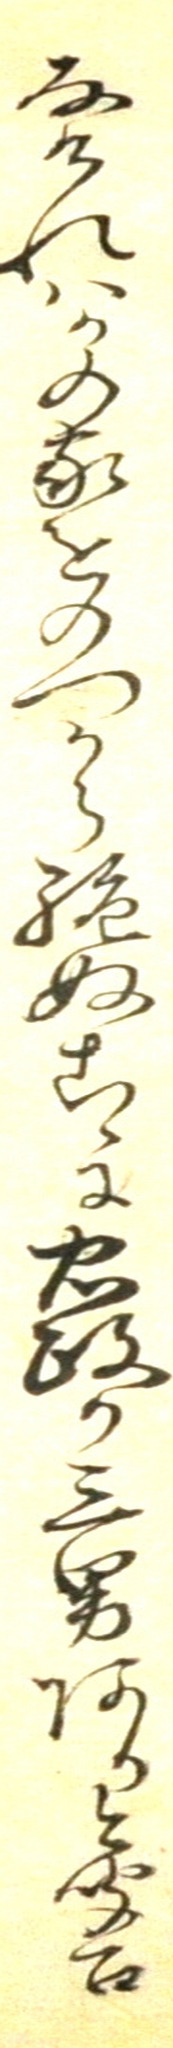なけれはかの家をのつから絶ぬこゝに忠政か三男ありと聞召
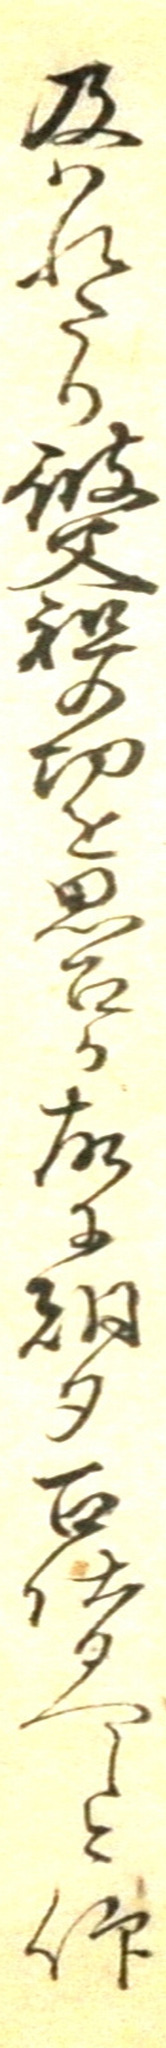及はれたり彼父祖の功を思召か故に朝夕召仕るへしと仰
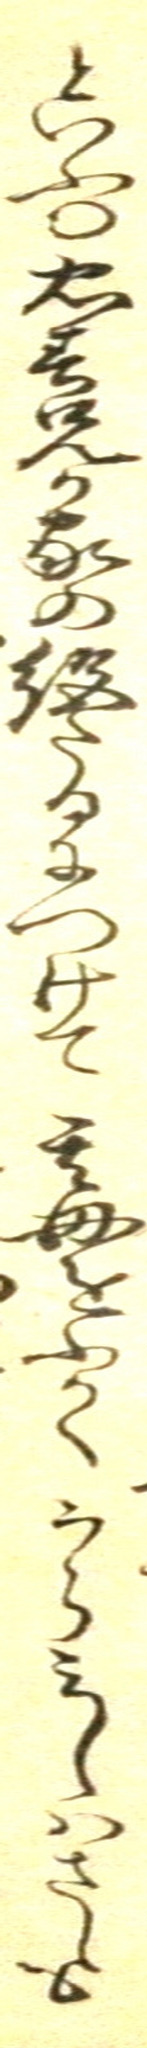といふ〇忠春兄か家の絶たるにつけて其母をふかくうらみしはさしも
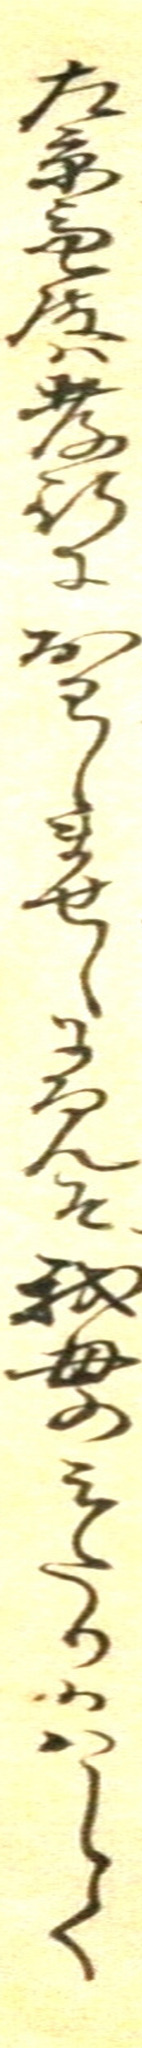左京亮殿は孝行におわしませしになんそ我母のみたりかはしく
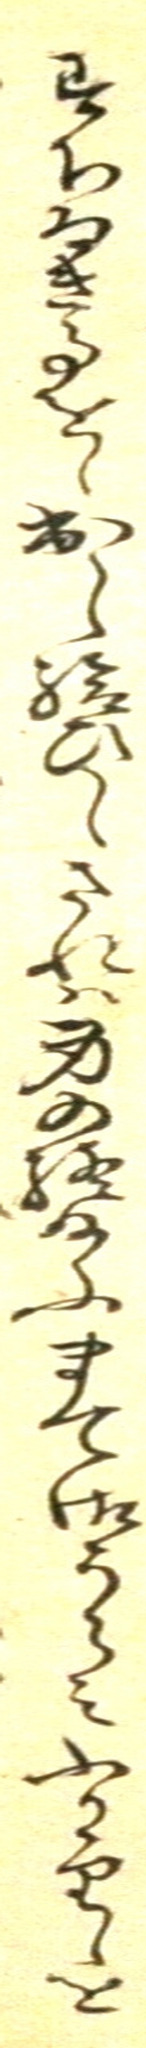すちなき事をし出し給ひしされは身の終給ふまて御うらみふかゝりしを
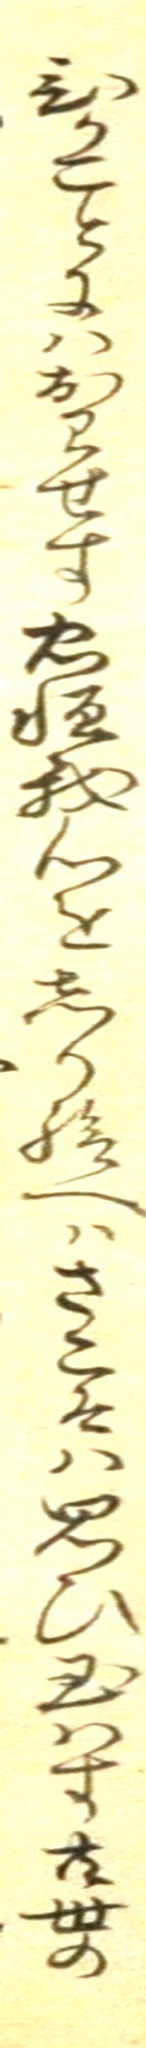ひかことにはおわせす忠恒我心をしり給へはさこそは思ひ玉はす共世の
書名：藩翰譜（四・中）
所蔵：伊那市立高遠町図書館・合同会社AMANE
